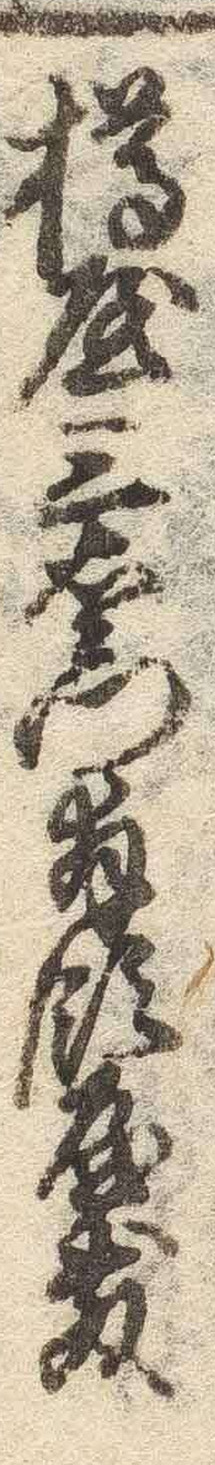樽屋三右衛門拝領屋敷
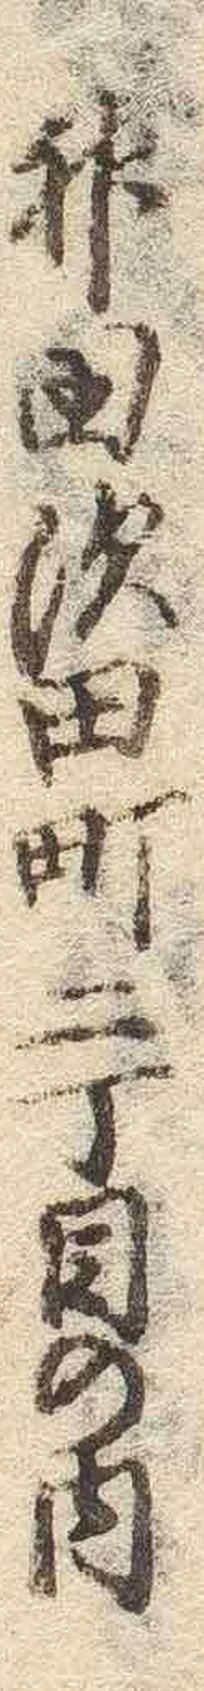神田須田町二丁目の内
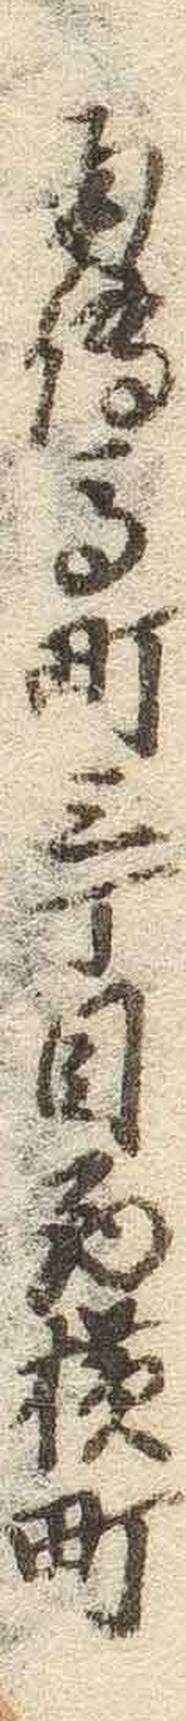南伝馬町三丁目西横町
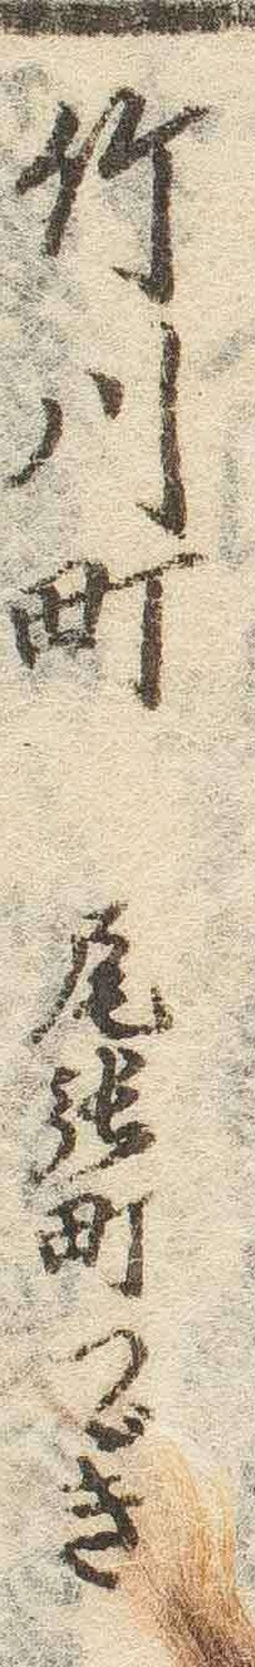竹川町尾張町つゞき
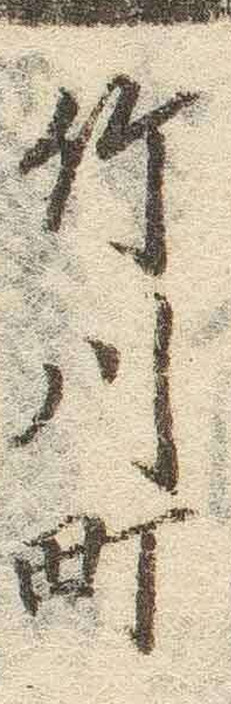竹島町
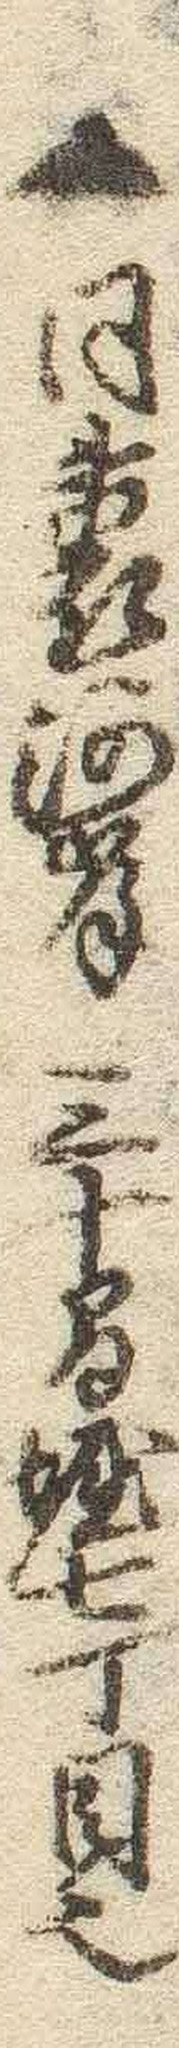▲同裏河岸三十間堀七丁目也
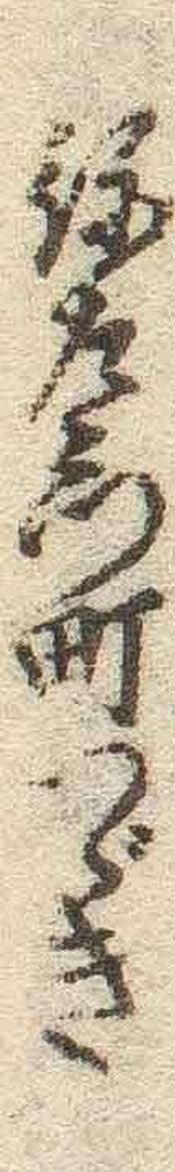弥左衛門町つゞき
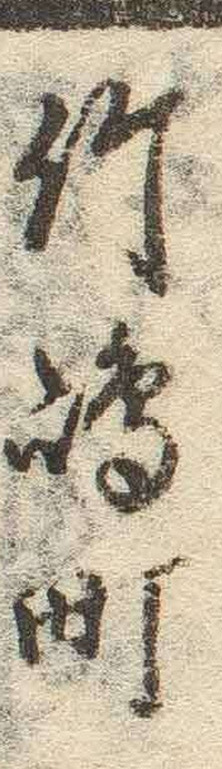竹島町
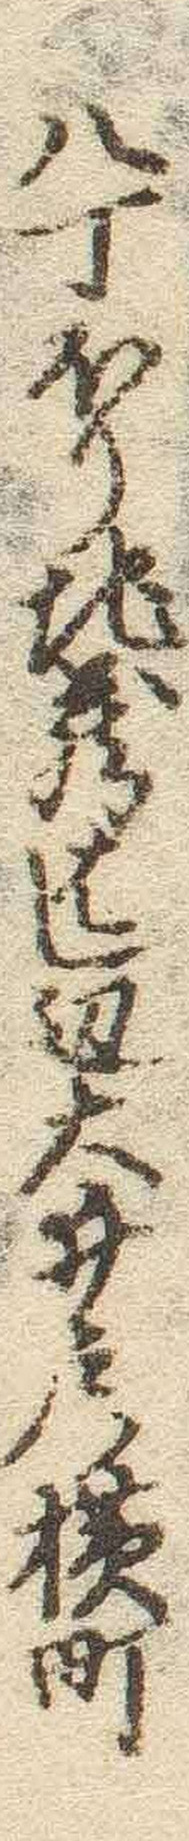八丁ほり地蔵はし辺大井戸ノ横町
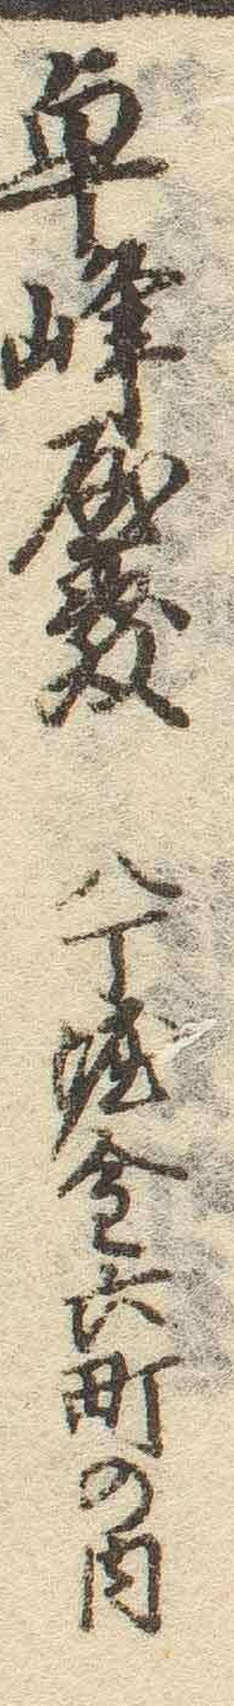卓峰屋敷八丁堀金六町の内
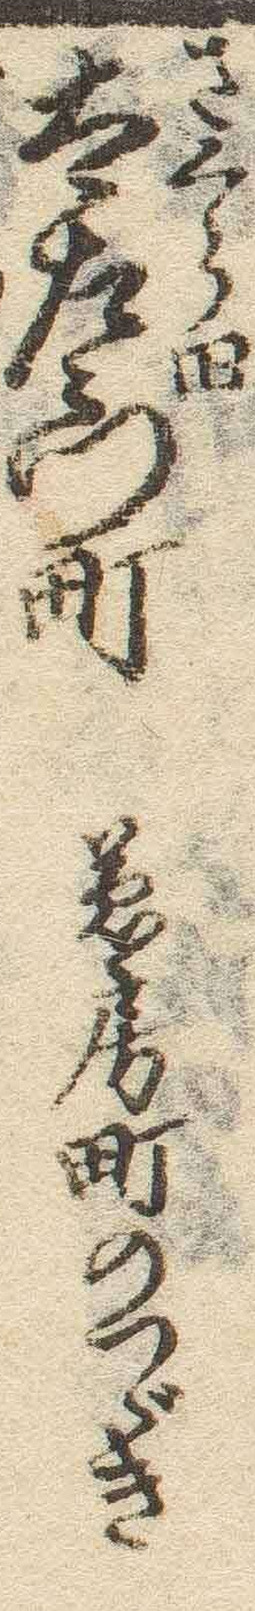太左衛門町兼房町のつゞき
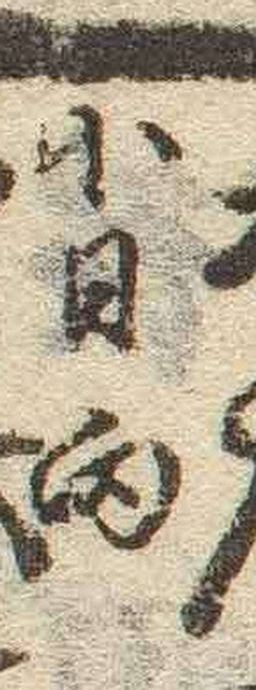小日向
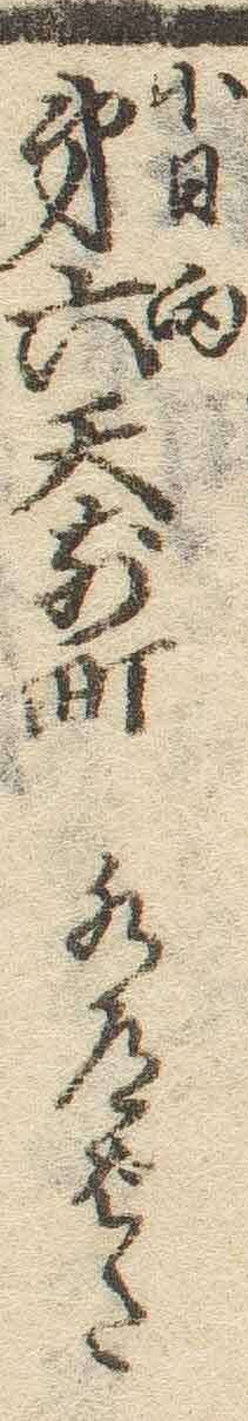第六天前町水道ばた
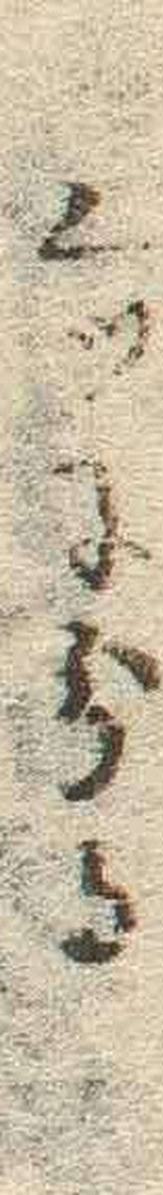三ッに分る
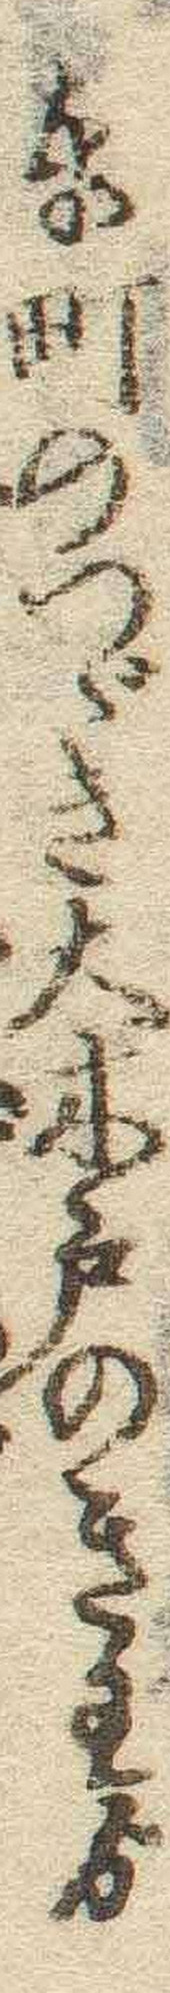東町のつゞき大木戸のきわゟ
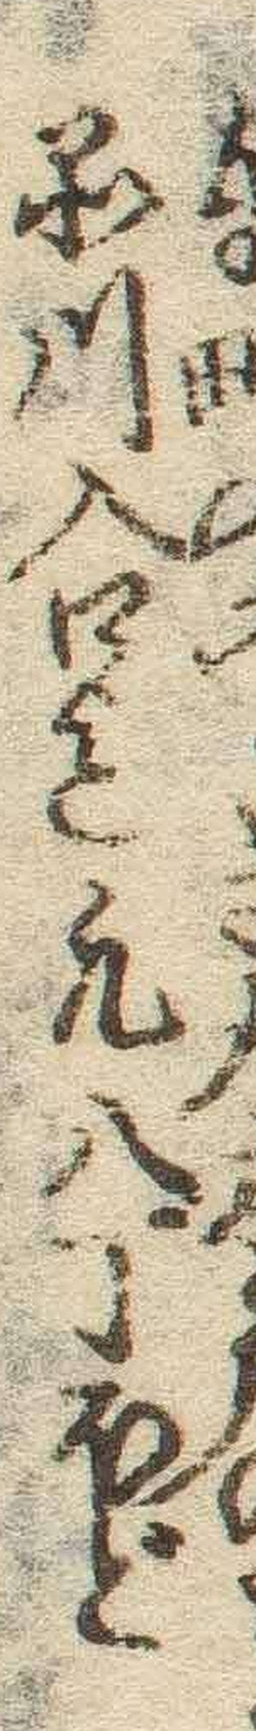品川入口迄凡八丁ほど
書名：江戸町独案内
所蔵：東京学芸大学附属図書館 国文学研究資料館
